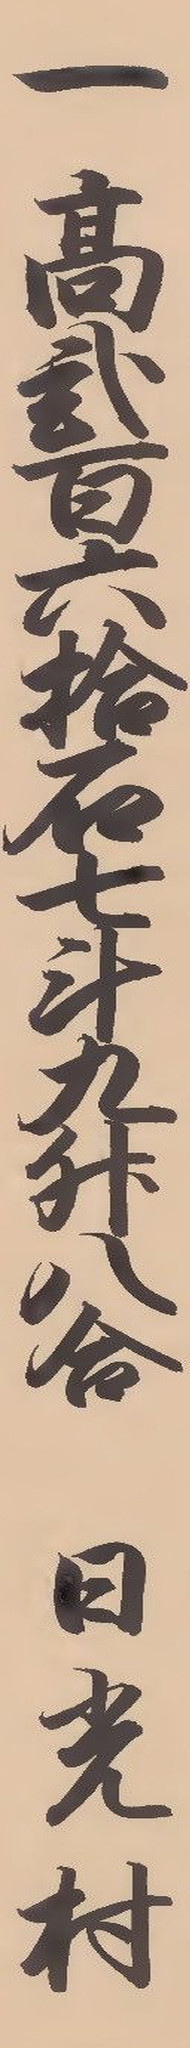一高弐百六拾石七斗九升八合日光村
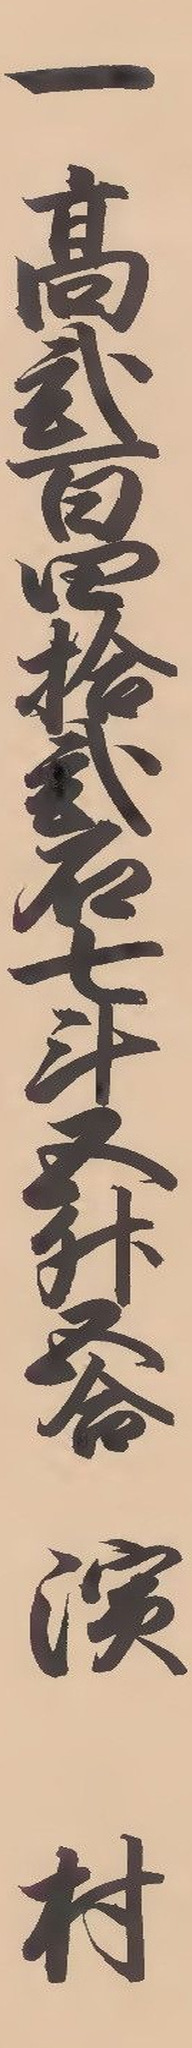一高弐百四拾弐石七斗五升五合浜村
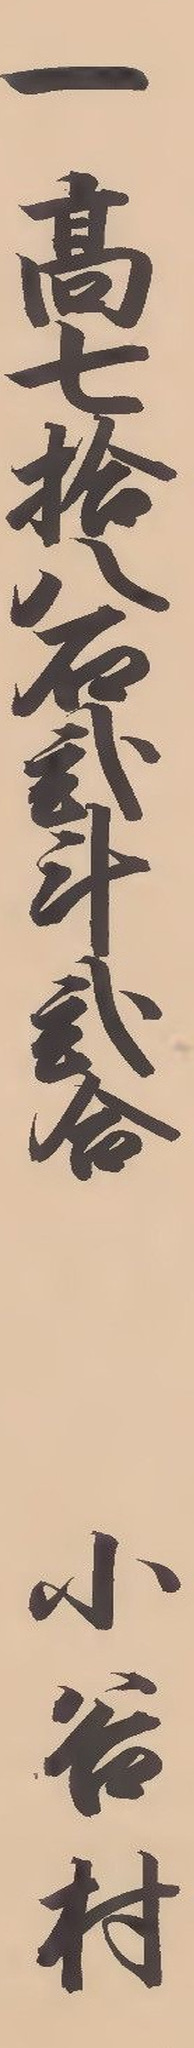一高七拾八石弐斗弐合小谷村
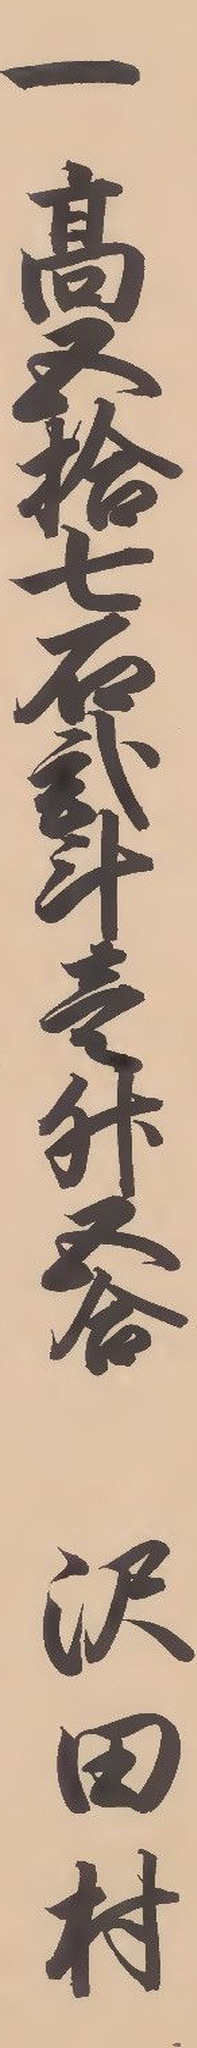一高五拾七石弐斗壱升五合沢田村
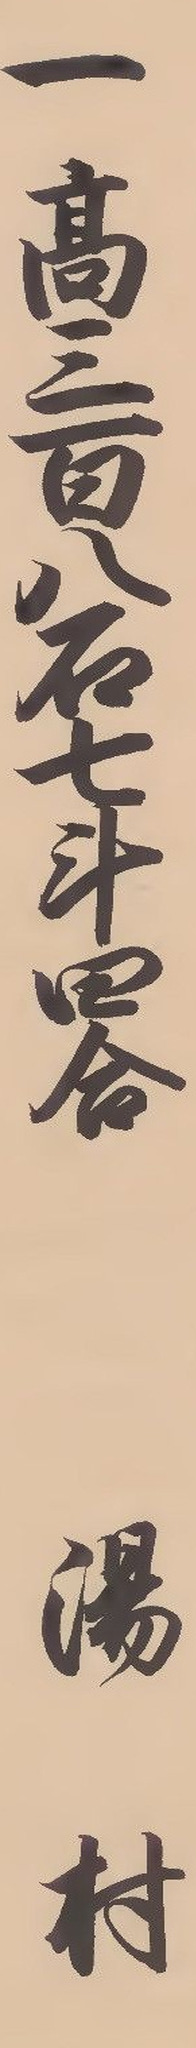一高三百八石七斗四合湯村
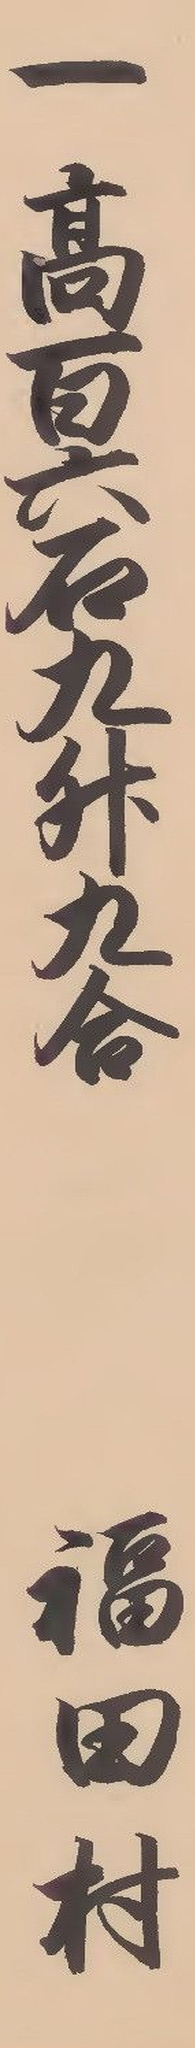一高百六石九升九合福田村

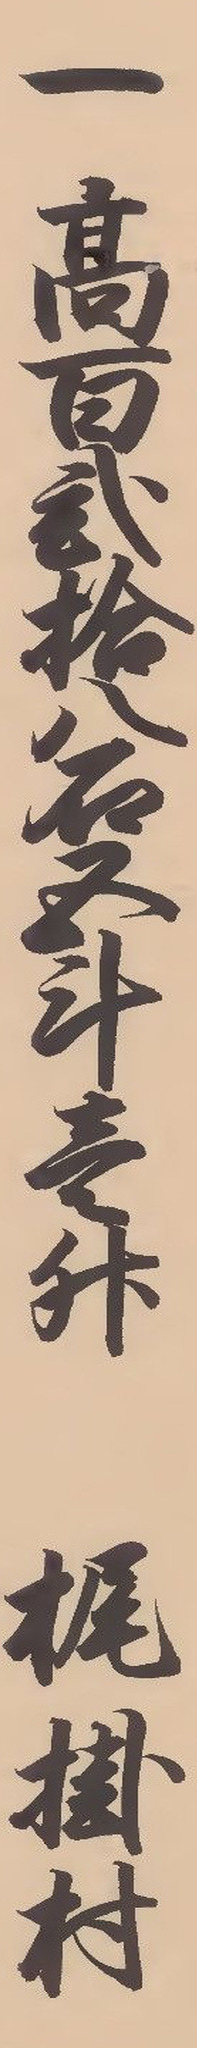一高百弐拾八石五斗壱升梶掛村
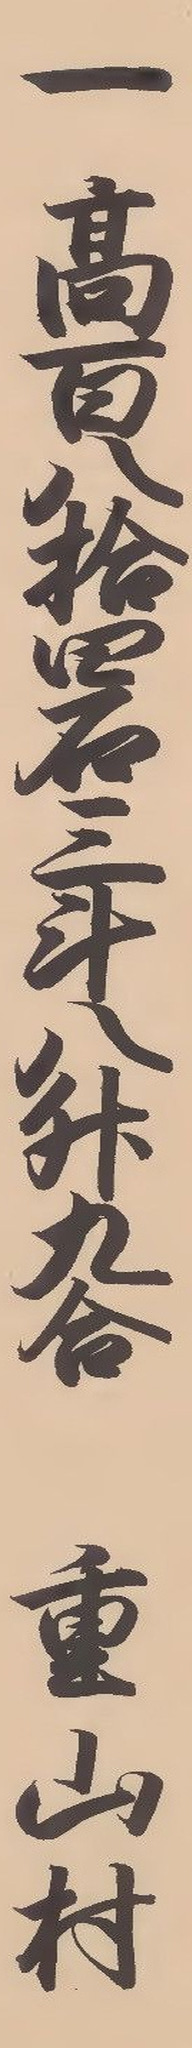一高百八拾四石三斗八升九合重山村
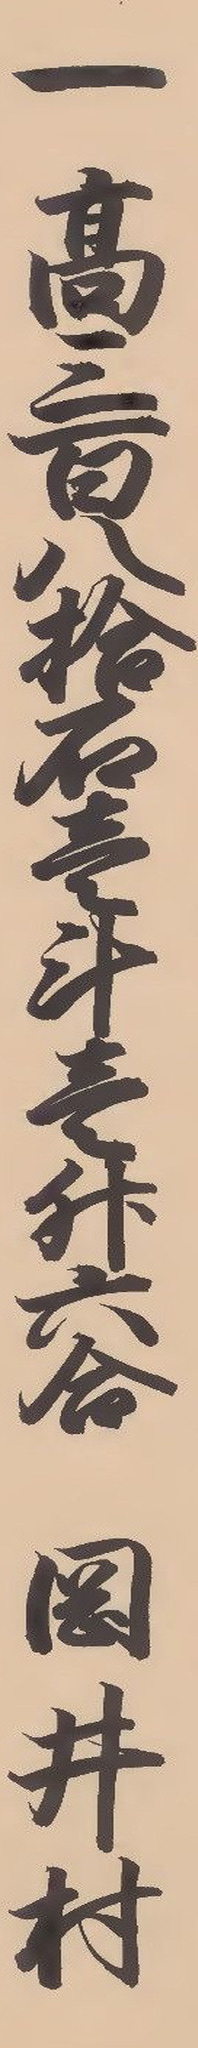一高三百八拾石壱斗壱升六合岡井村
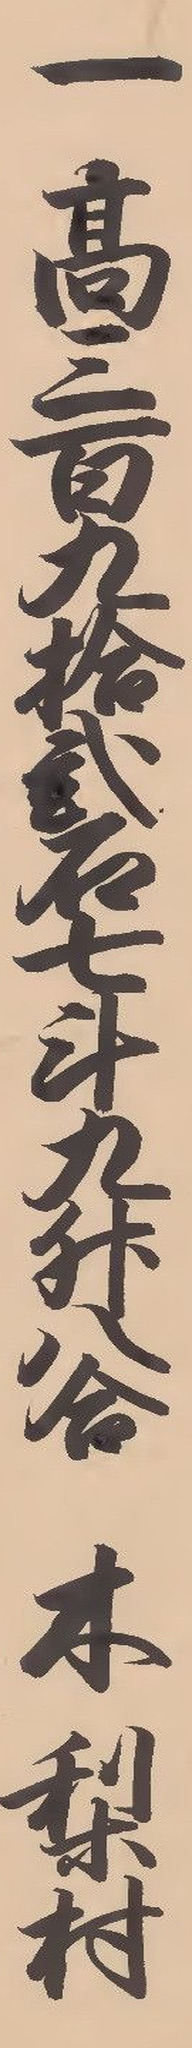一高三百九拾弐石七斗九升八合木梨村
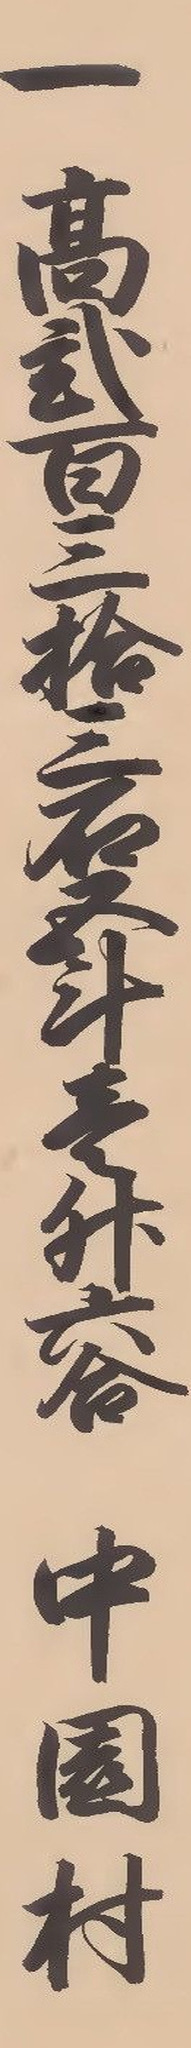一高弐百三拾三石五斗壱升六合中園村
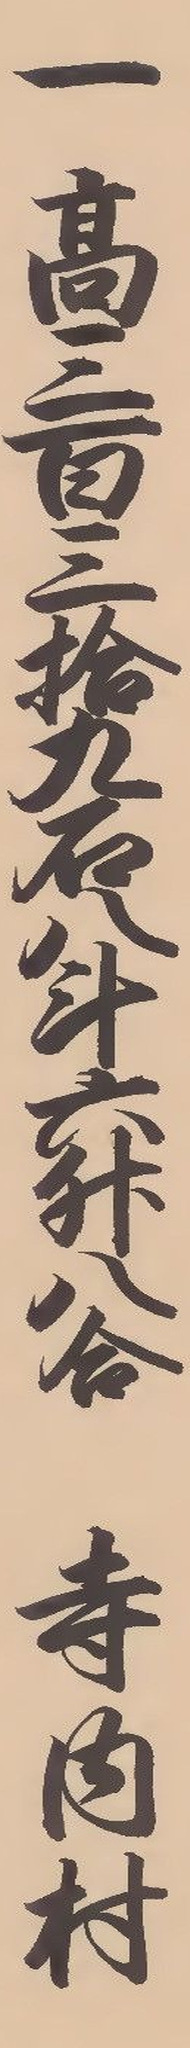一高三百三拾九石八斗六升八合寺内村
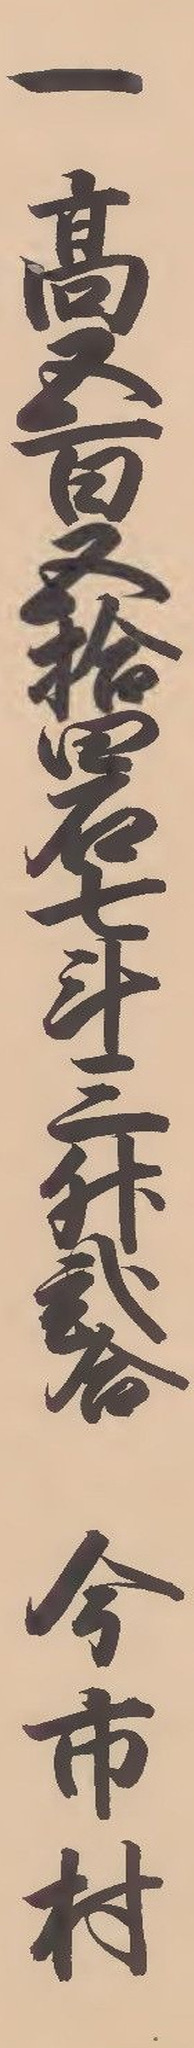一高五百五拾四石七斗三升弐合今市村

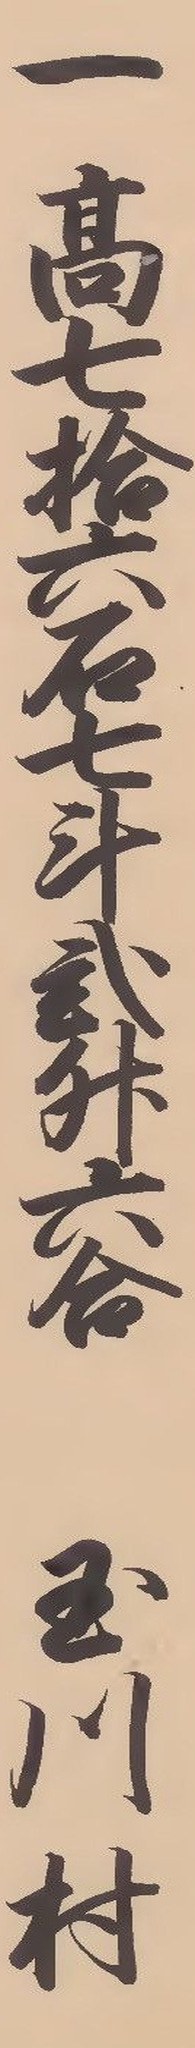一高七拾六石七斗弐升六合玉川村
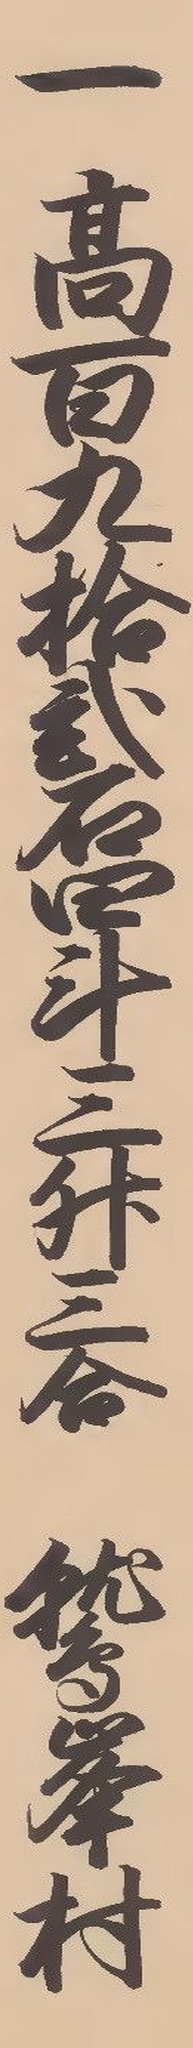一高百九拾弐石四斗三升三合鷲峰村
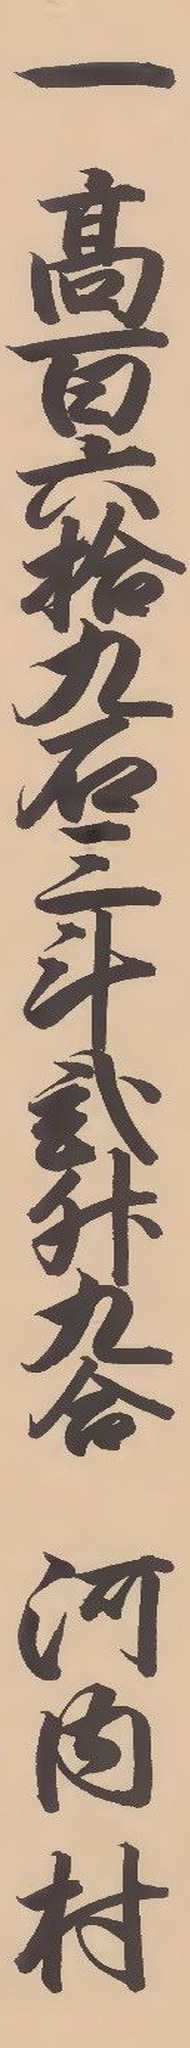一高百六拾九石三斗弐升九合河内村
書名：因幡国郷帳
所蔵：国立公文書館 National Archives of Japan
